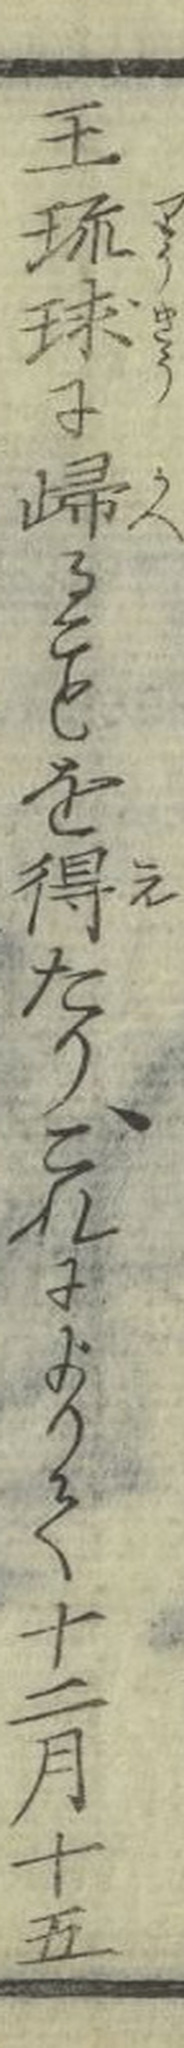王琉球に帰ることを得たり、これによりて十二月十五
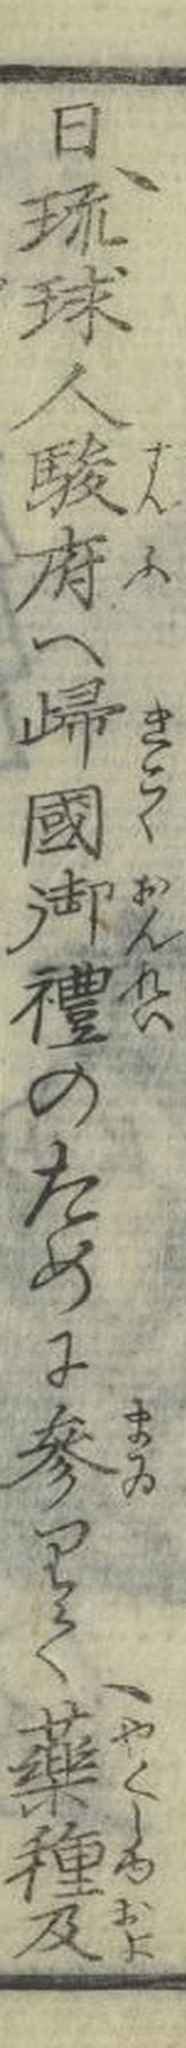日、琉球人駿府へ帰国御礼のために参りて、薬種及
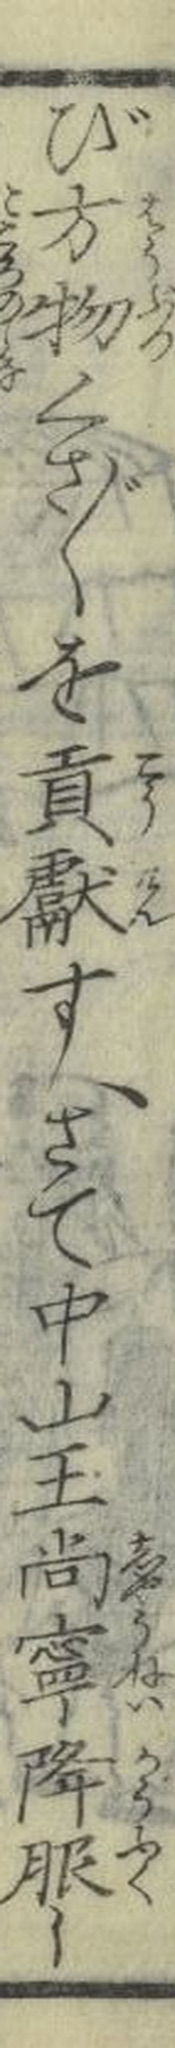び方物くさ〴〵を貢献す、さて中山王尚寧降服し
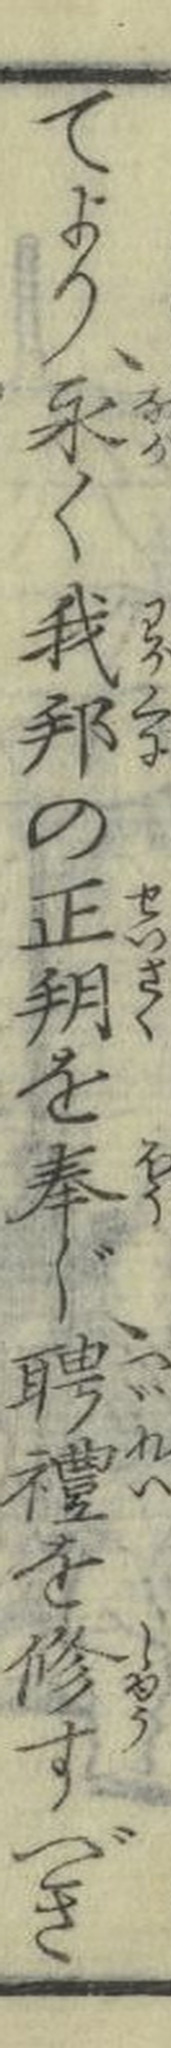てより、永く吾邦の正朔を奉じ、聘礼を修すべき
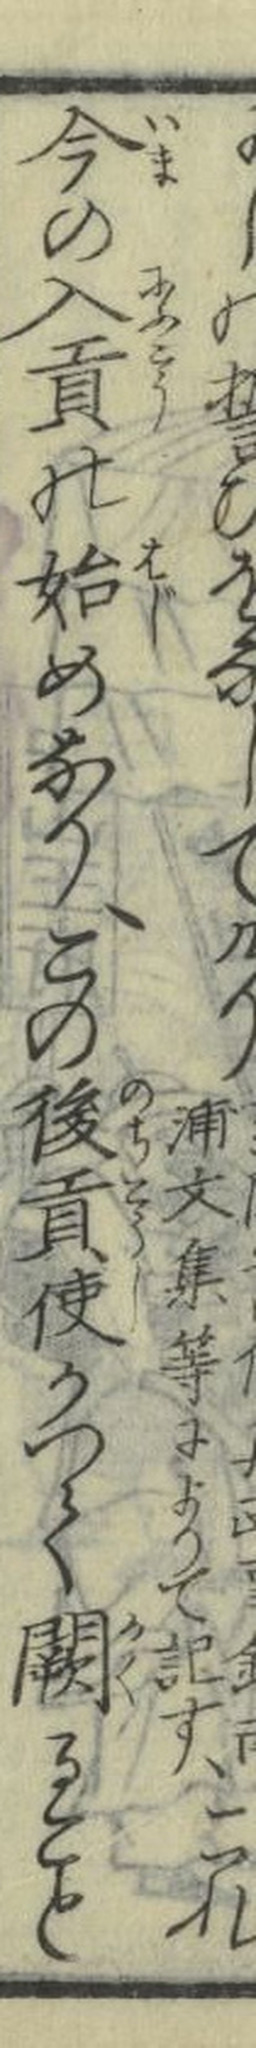今の入貢の始めなり、この後貢使かつて闕ること
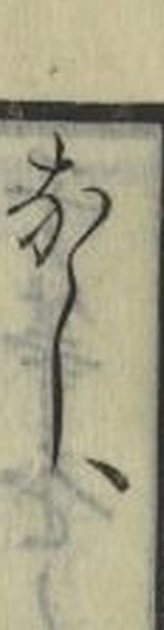なし、
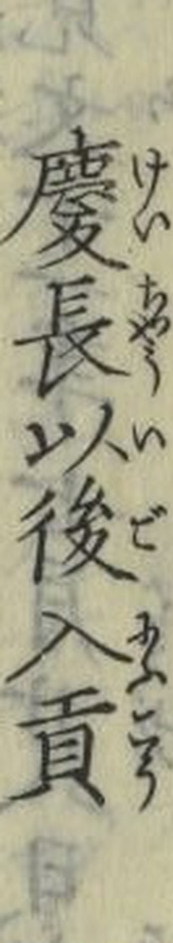慶長以後入貢
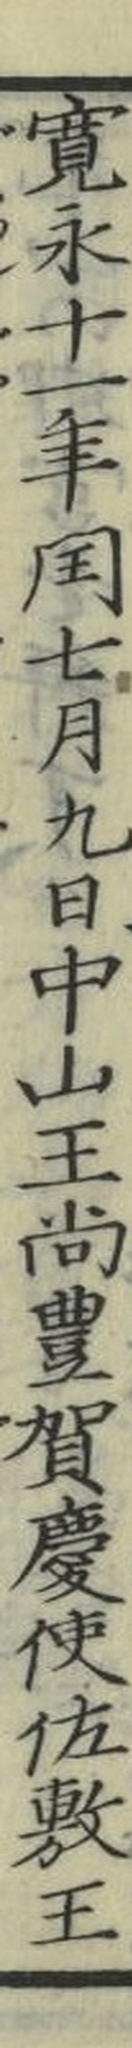寛永十一年閏七月九日、中山王尚豊、賀慶使佐敷王
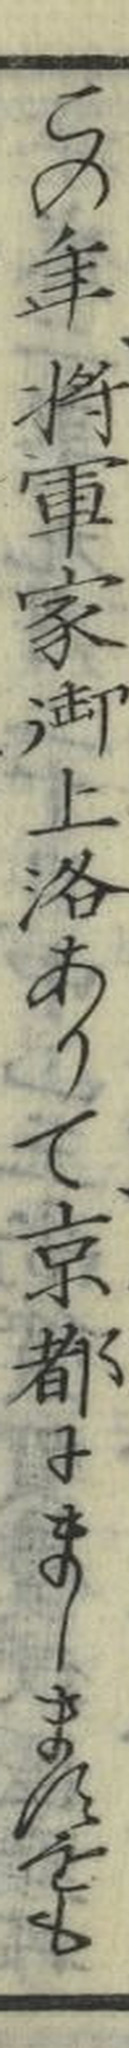この年、将軍家御上洛ありて、京都にましますをも
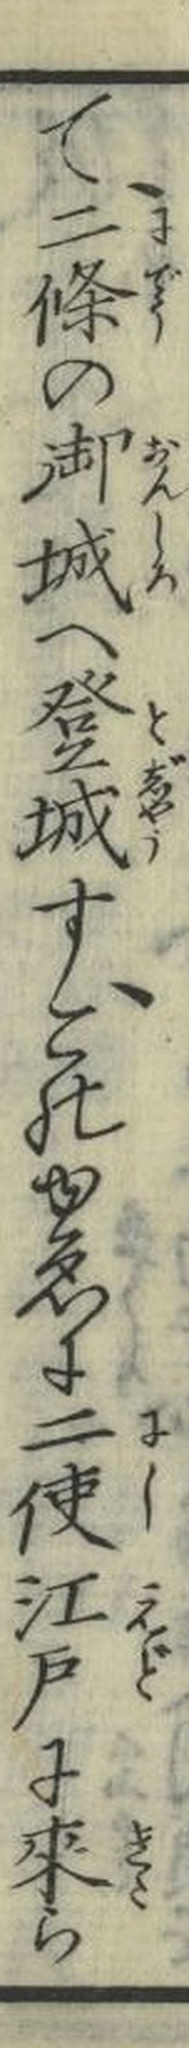て、二条の御城へ登城す、このゆゑに二使江戸に来ら
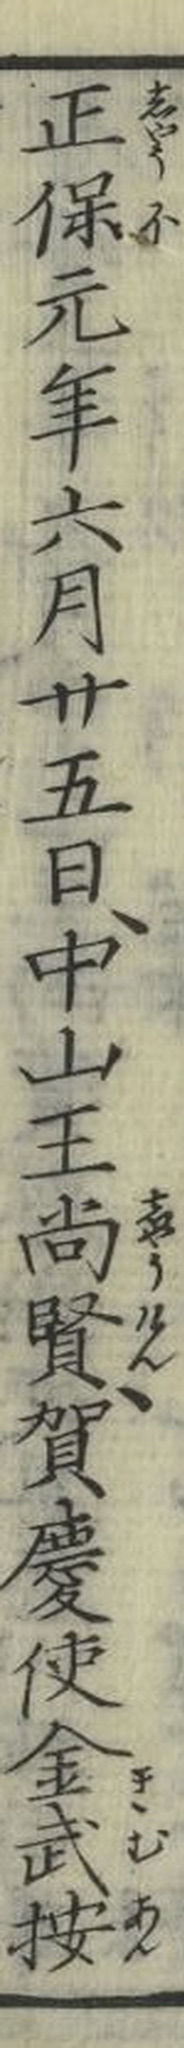正保元年六月廿五日、中山王尚賢、賀慶使金武按
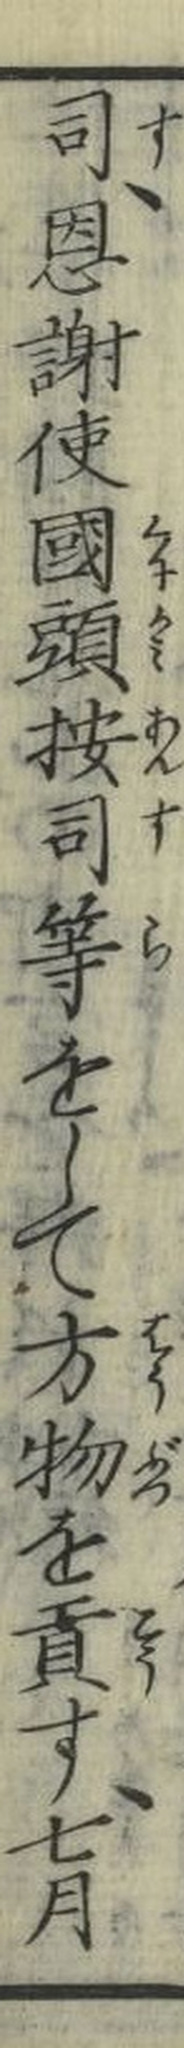司、恩謝使国頭按司等をして、方物を貢す、七月

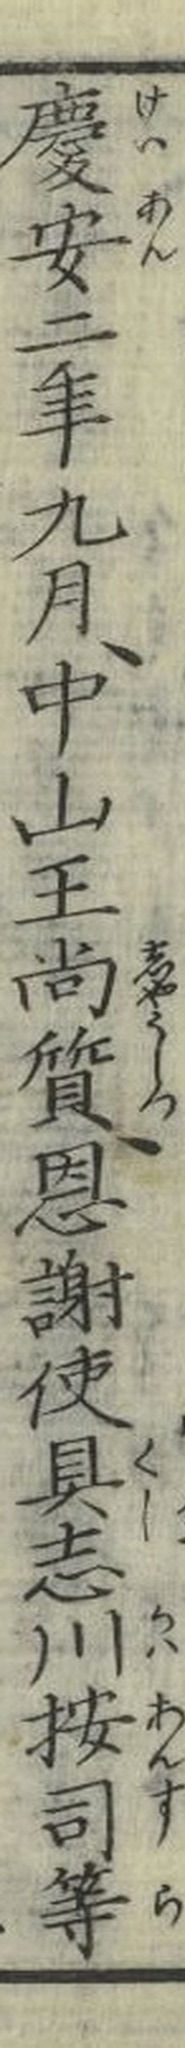慶安二年九月、中山王尚質、恩謝使具志川按司等
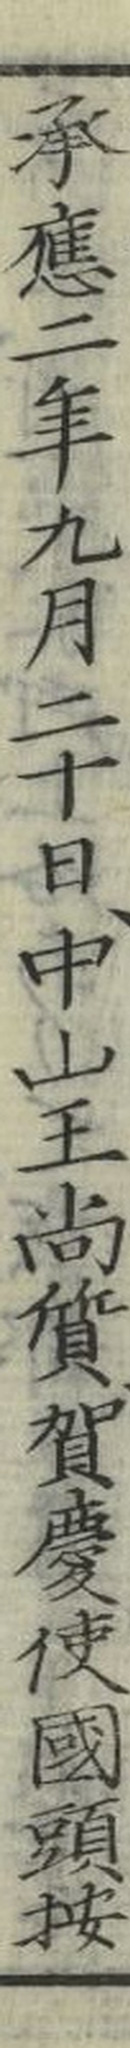承応二年九月二十日、中山王尚質、賀慶使国頭按
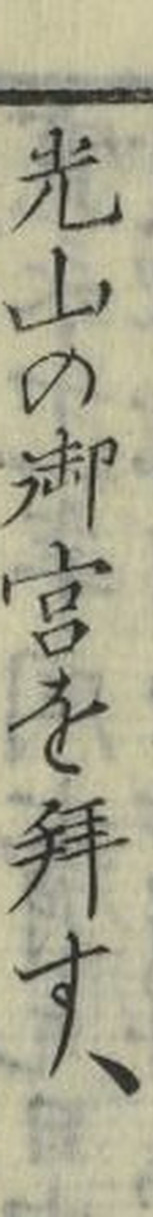光山の御宮を拝す、
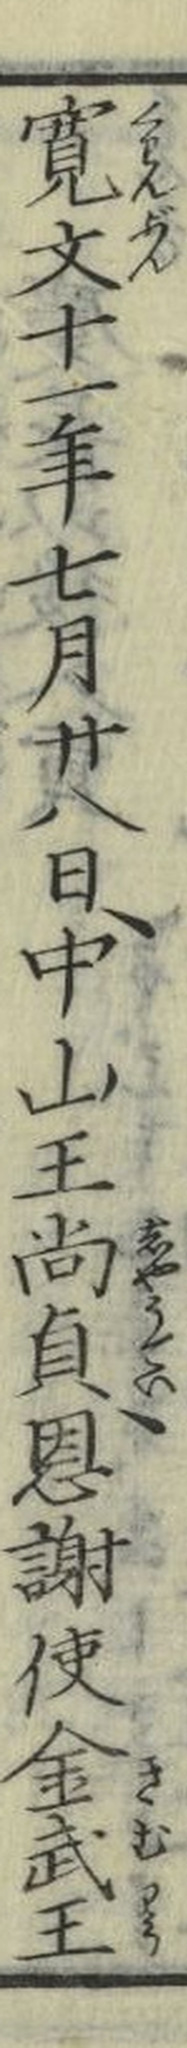寛文十一年七月廿八日、中山王尚貞、恩謝使金武王
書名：琉球入貢紀畧
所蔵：University of the Ryukyus Library
